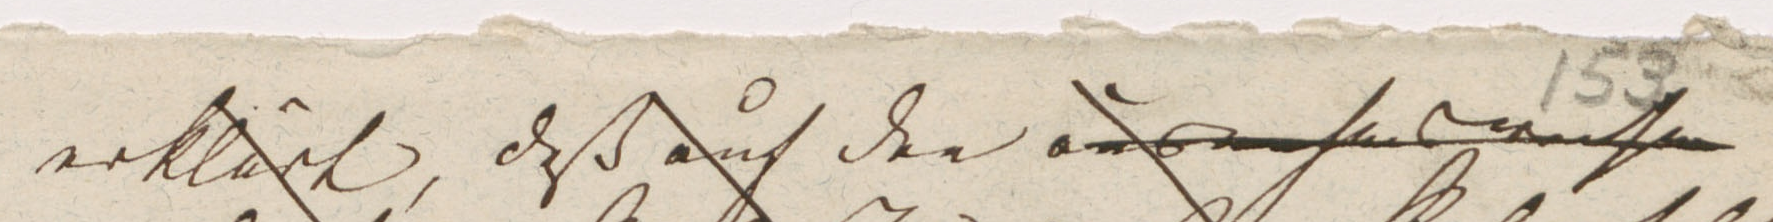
erklärt, dass auf den ausnahmsweise
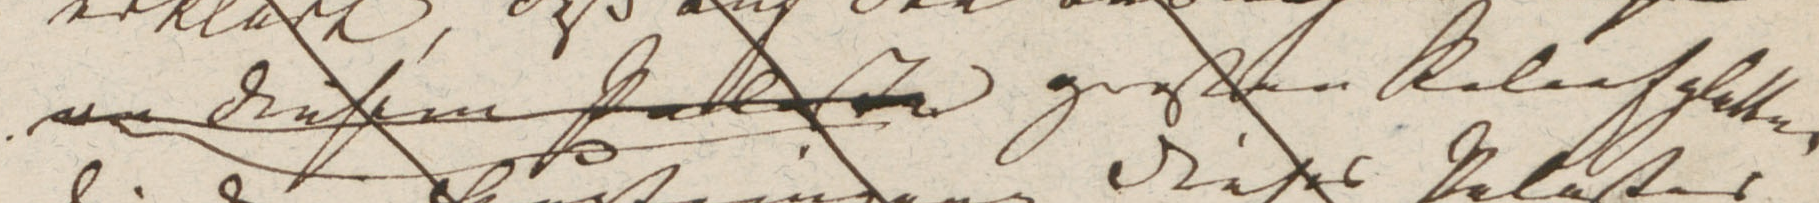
an diesem Palaste grossen Reliefplatten
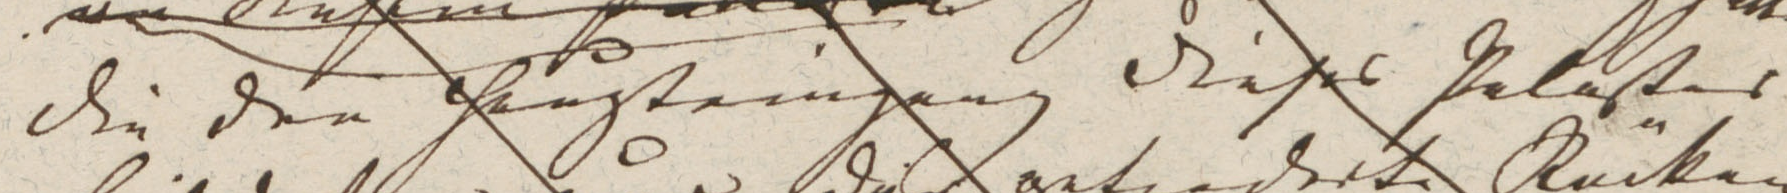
die den Haupteingang dieses Palastes
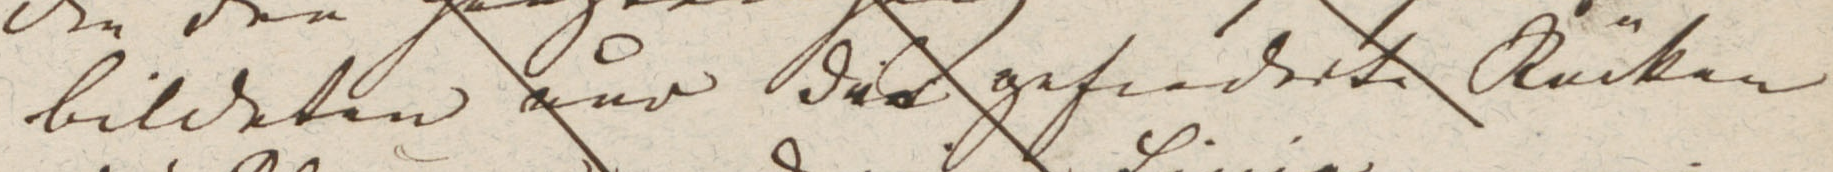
bildeten nur dieer gefiederte Rücken
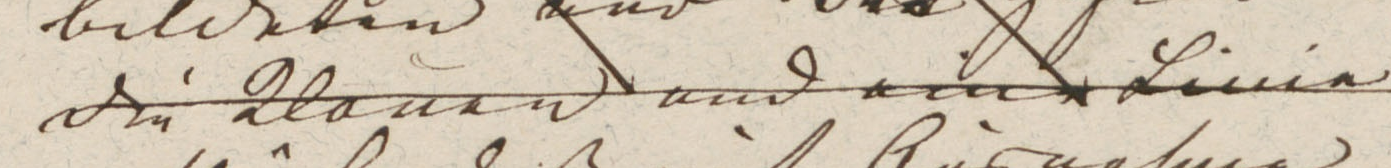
die Klauen und eine Linie
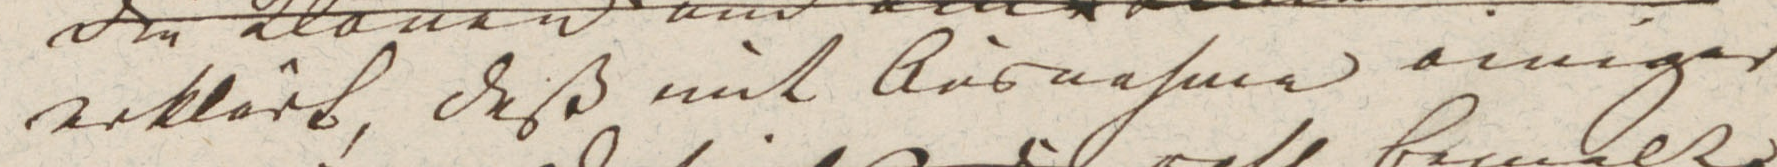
erklärt, dass mit Ausnahme einiger
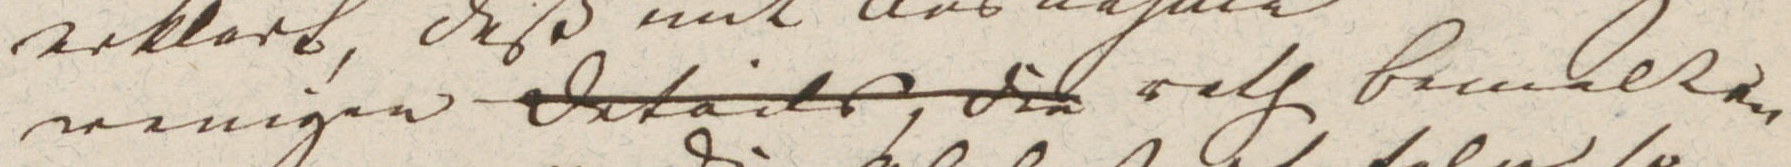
wenigen Details, die roth bemalten
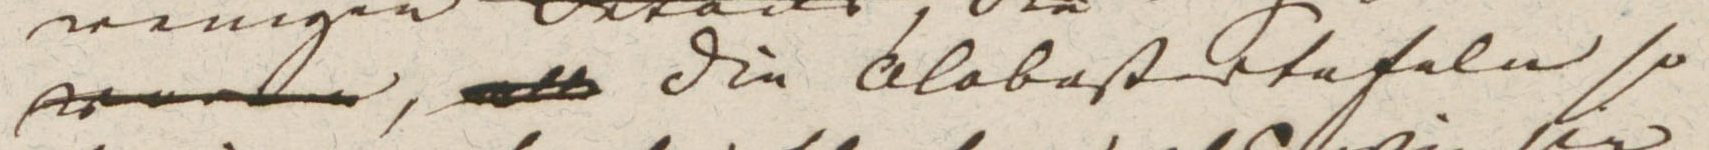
waren, all die Alabastertafeln so
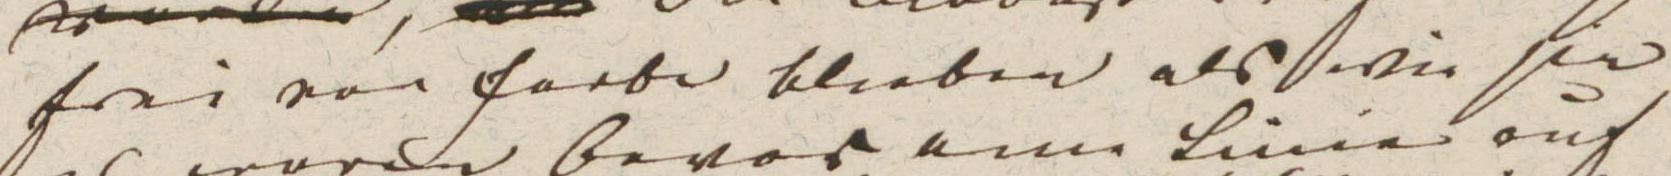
frei von Farbe blieben als wie sie
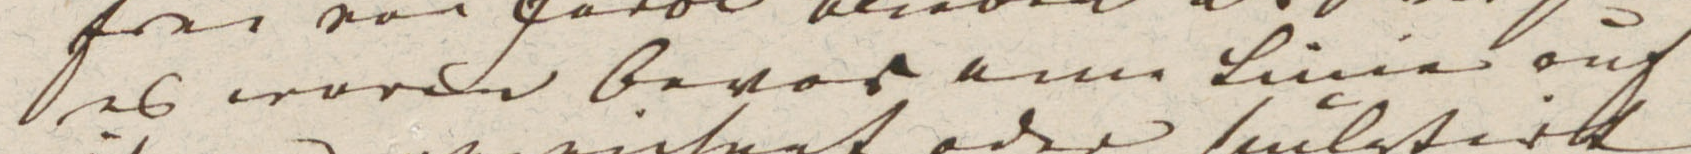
es waren bevor eine Linie auf
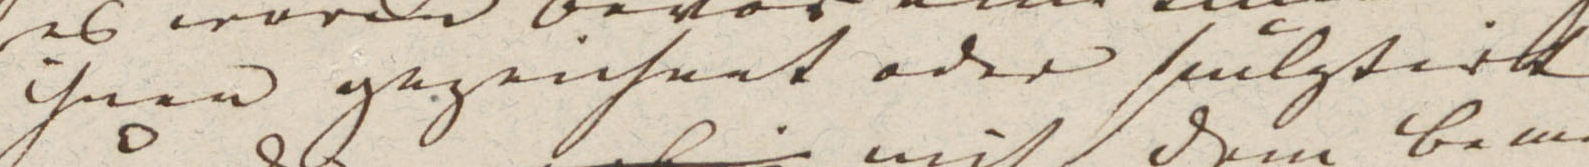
ihnen gezeichnet oder sculptirt
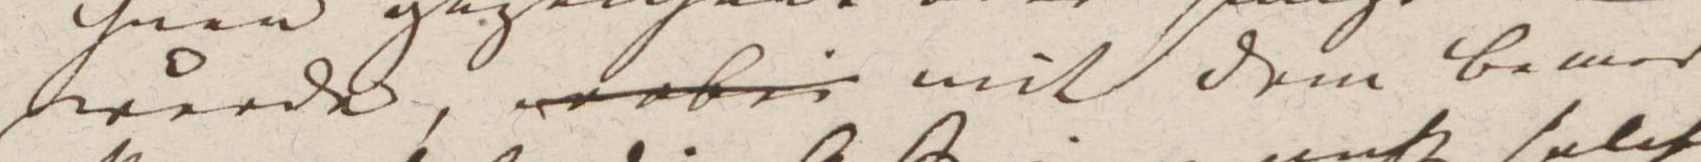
wurde, wobei mit dem Bemer-
